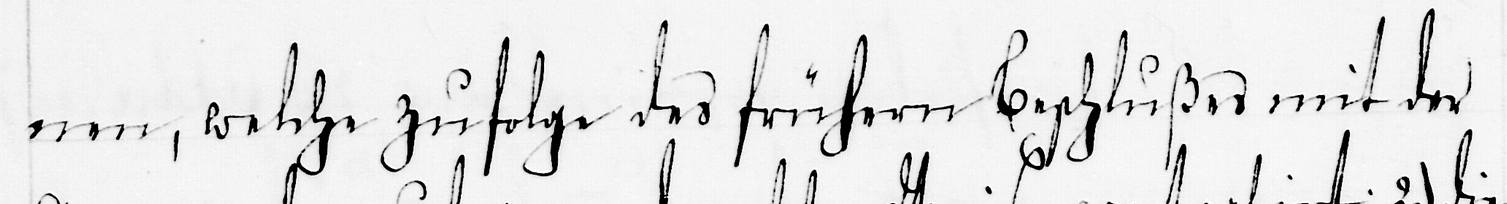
nen, welche zufolge des frühern Beschlußes mit der
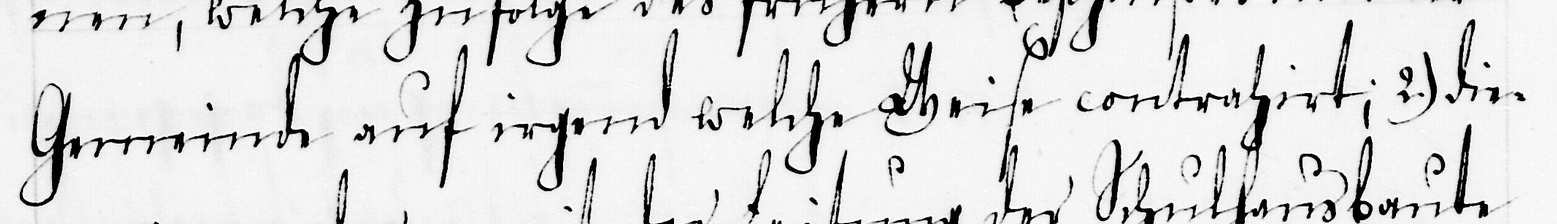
Gemeinde auf irgend welche Weise contrahirt; 2.) di¬
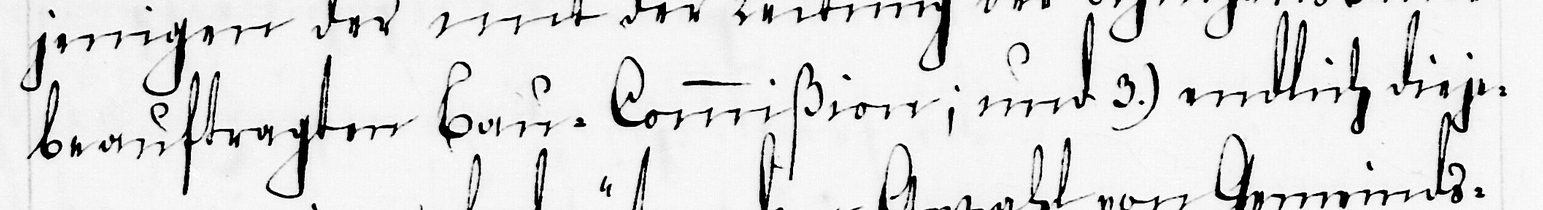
beauftragten Bau-Commißion; und 3.) endlich dieje¬
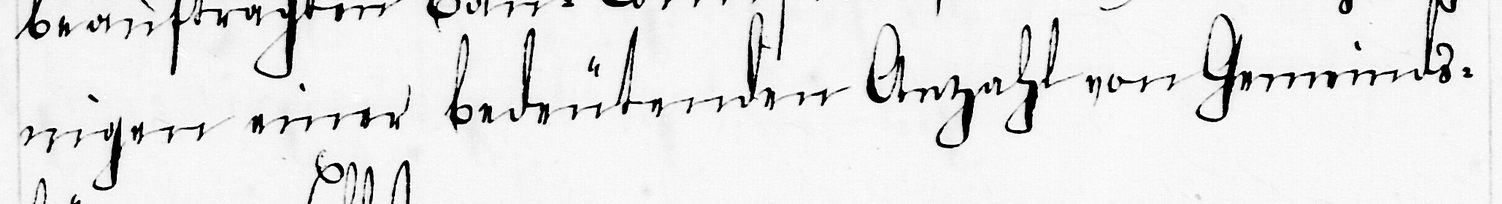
nigen einer bedeutenden Anzahl von Gemeinds¬
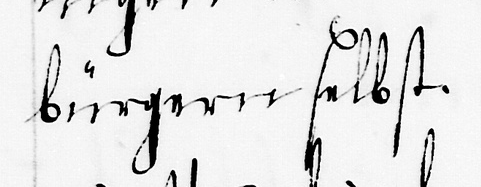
bürgern selbst.
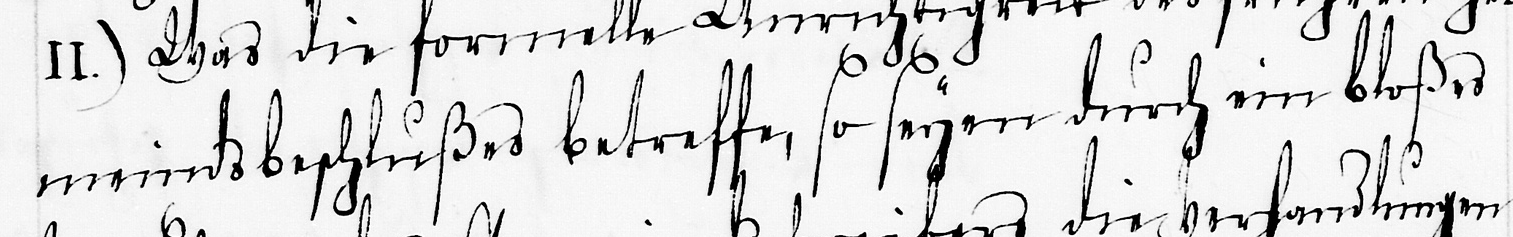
meindsbeschlußes betreffe, so seyen durch ein bloßes
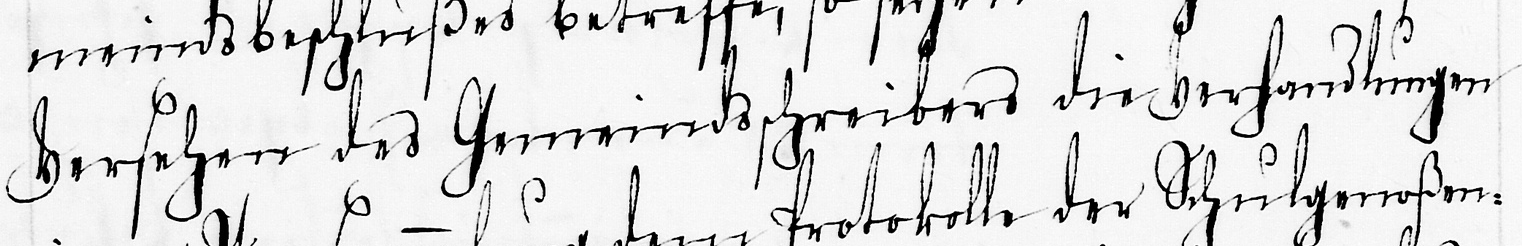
Versehen des Gemeindsschreibers die Verhandlungen
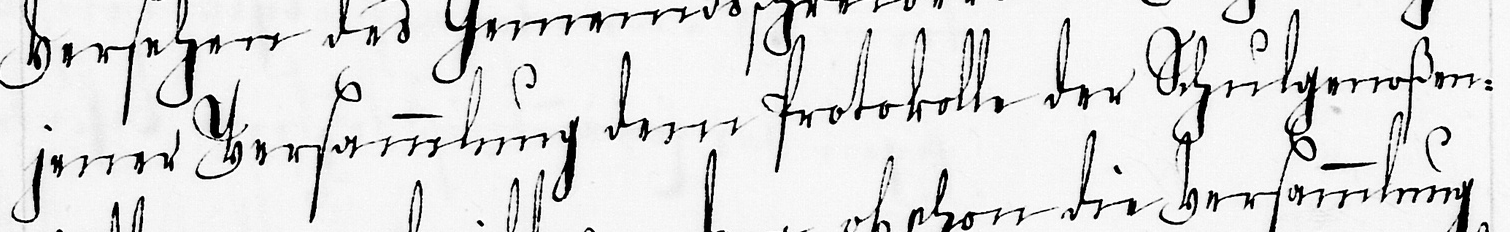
jener Versammlung dem Protokolle der Schulgenoßen¬
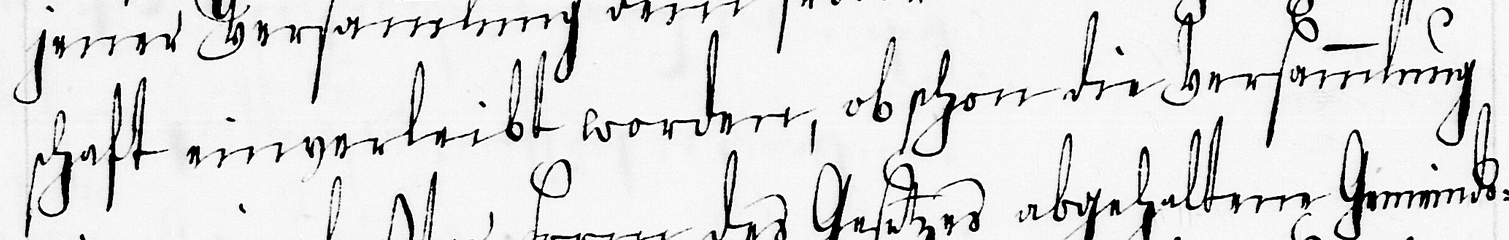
schaft einverleibt worden, obschon die Versammlung
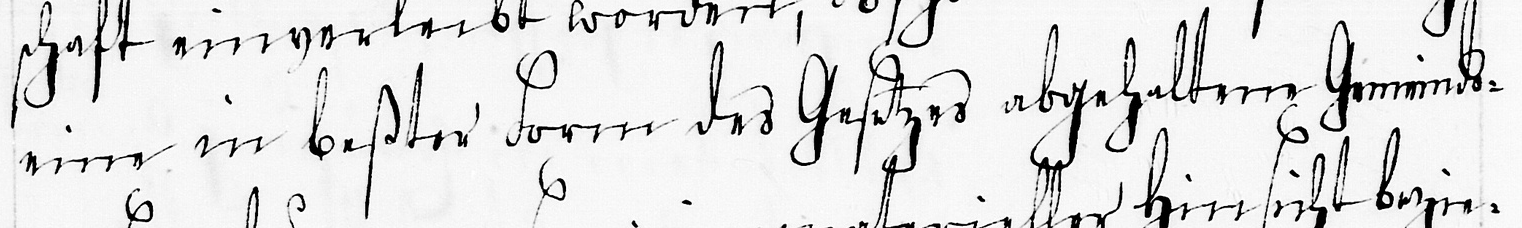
eine in beßter Form des Gesetzes abgehaltene Gemeinds¬
